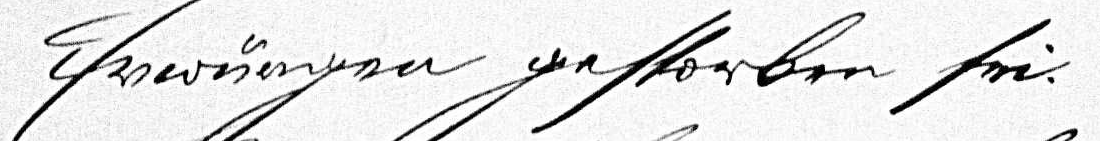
Erwürgen gestorben sei.
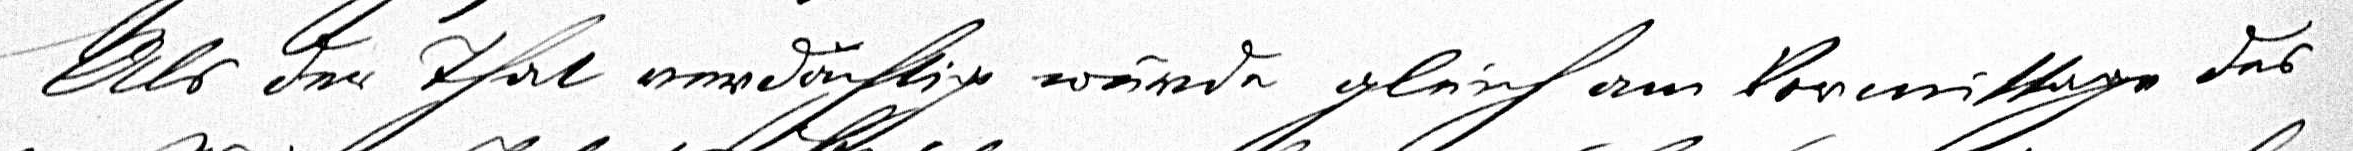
Als der That verdächtig wurde gleich am Vormittage des
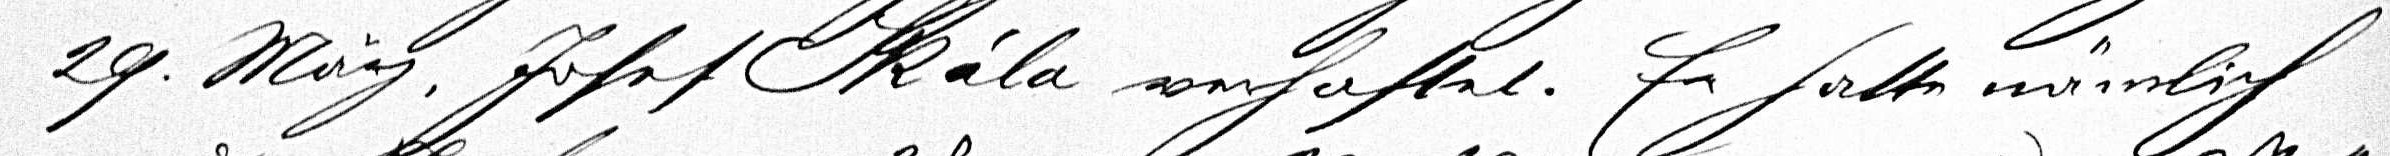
29. März, Josef Skála verhaftet. Er hatte nämlich
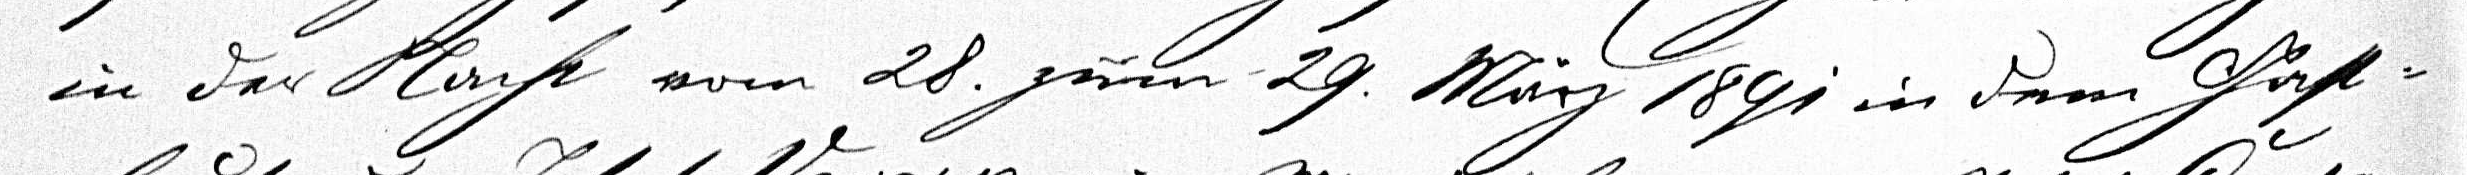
in der Nacht vom 28. zum 29. März 1891 in dem Gast¬
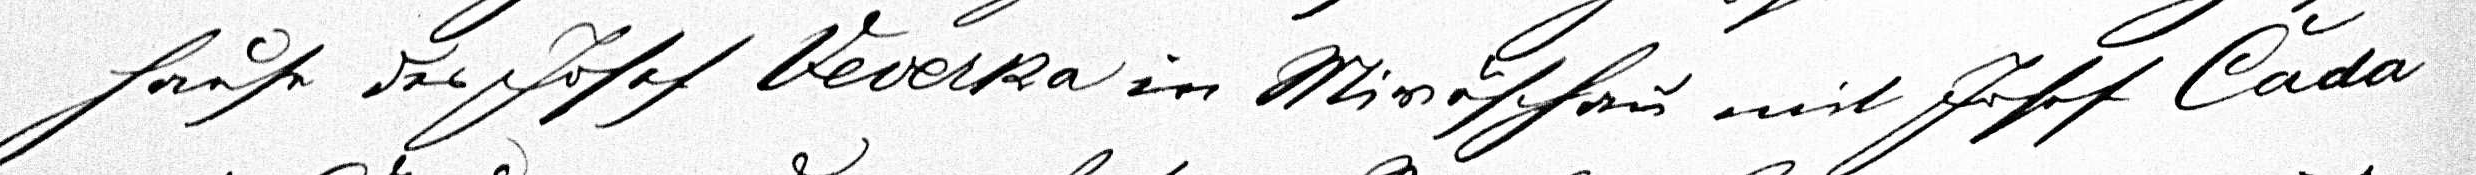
hause des Josef Veverka in Miröschau mit Josef Čada
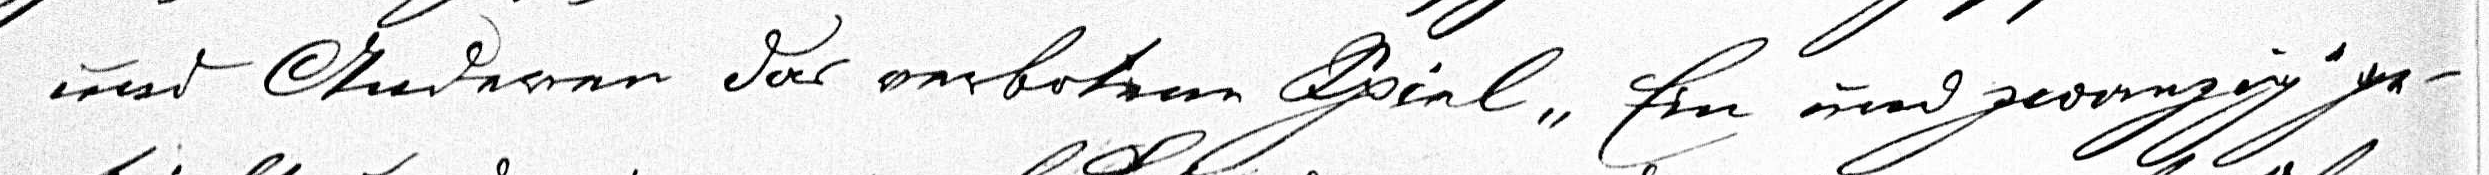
und Anderen das verbotene Spiel „Ein und zwanzig“ ge¬
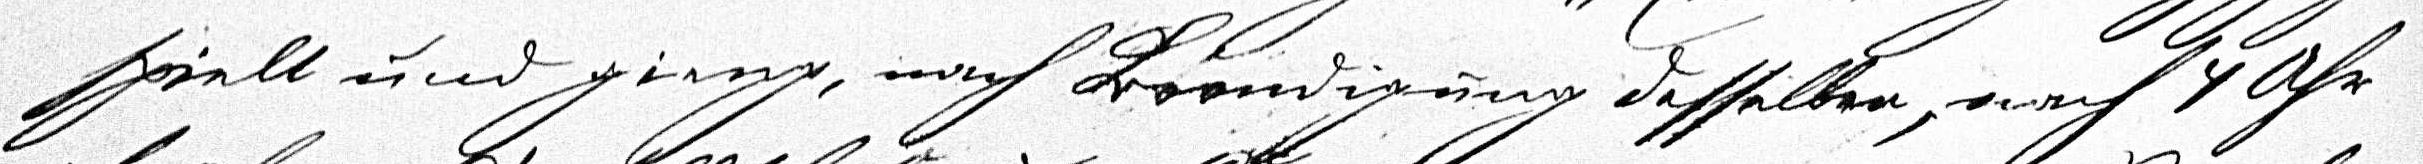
spielt und gieng, nach Beendigung desselben, nach 4 Uhr
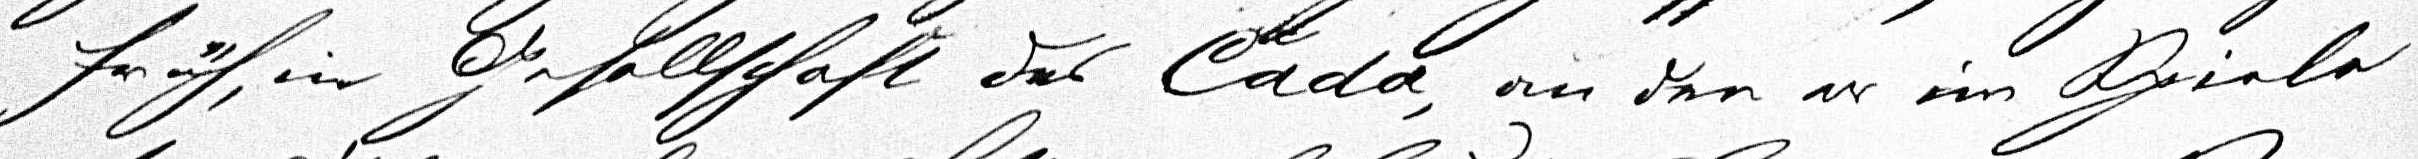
früh, in Gesellschaft des Čada, an den er im Spiele
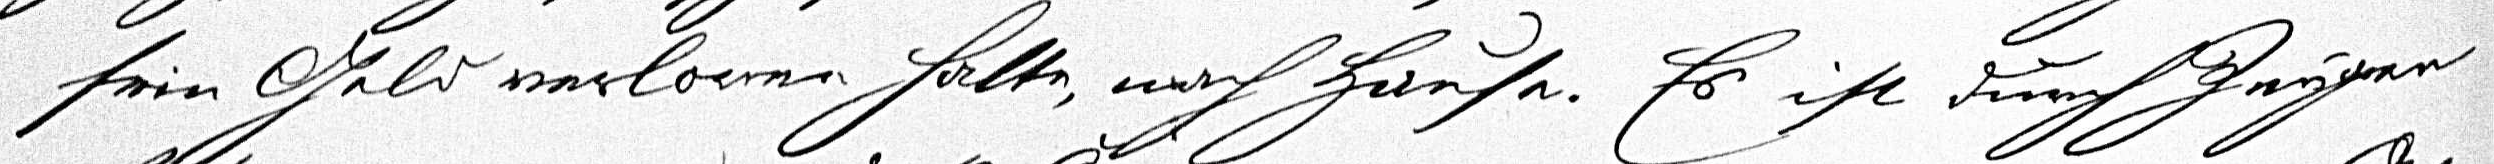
sein Geld verloren hatte, nach Hause. Es ist durch Zeugen
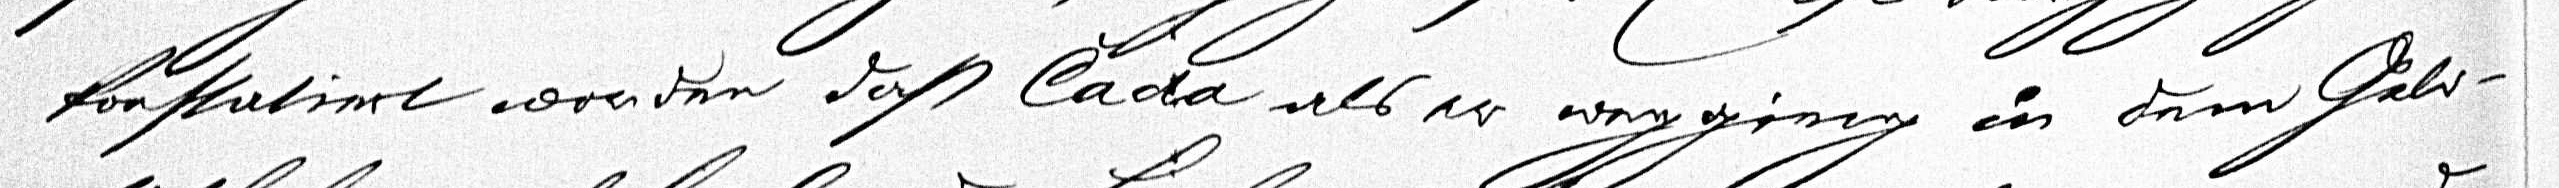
konstatiert worden, daß Čada als er wegging in dem Geld¬
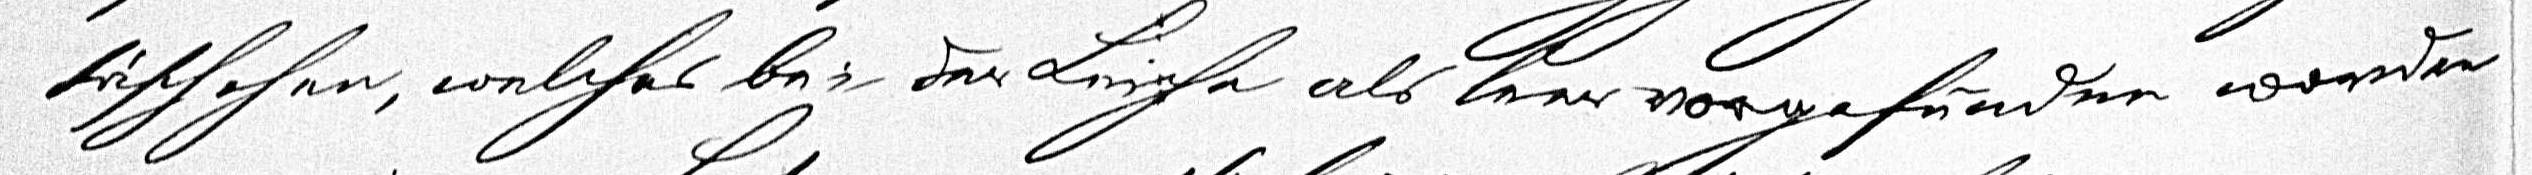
täschen, welches bei der Leiche als leer vorgefunden worden
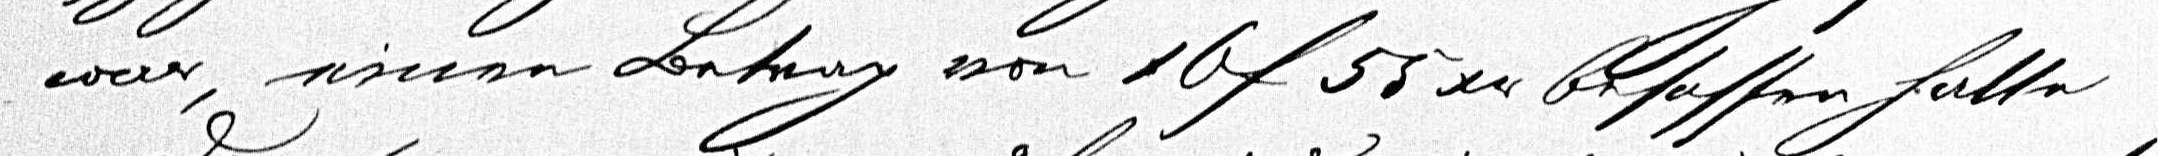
war, einen Betrag von 10f 55 xr besessen hatte.
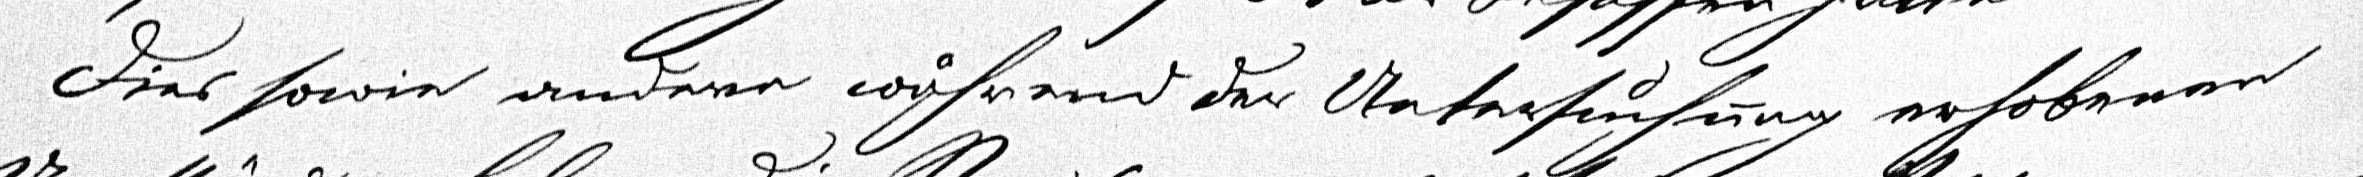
Dies sowie andere während der Untersuchung erhobenen
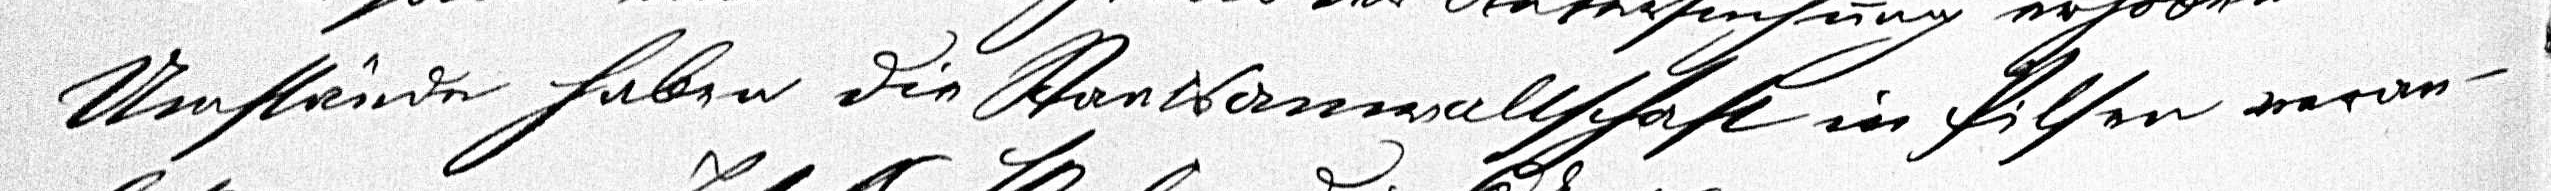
Ustände haben die Staatsanwaltschaft in Pilsen veran¬
